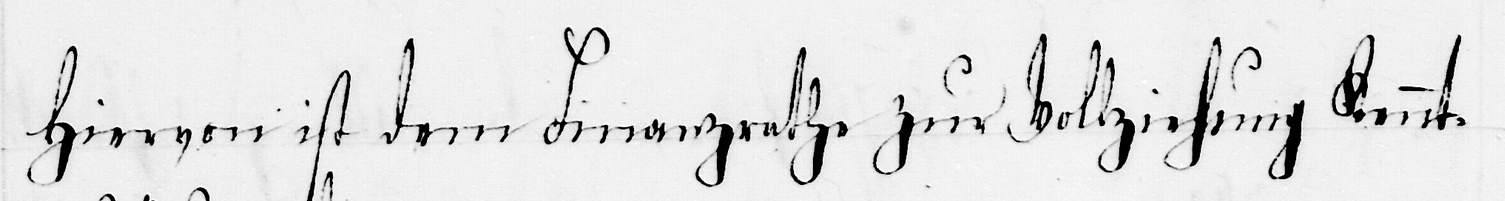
Hiervon ist dem Finanzrathe zur Vollziehung Kennt¬
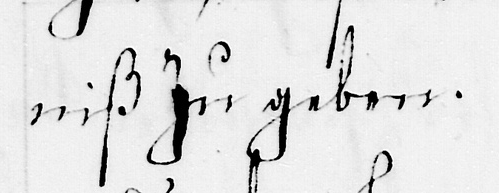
niß zu geben.
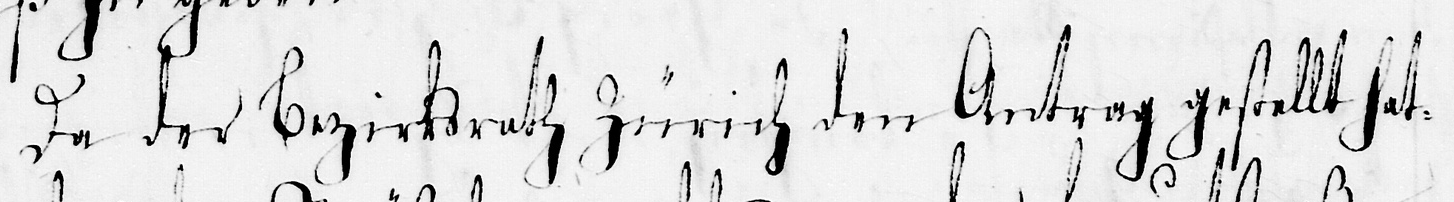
Da der Bezirksrath Zürich den Antrag gestellt ha¬
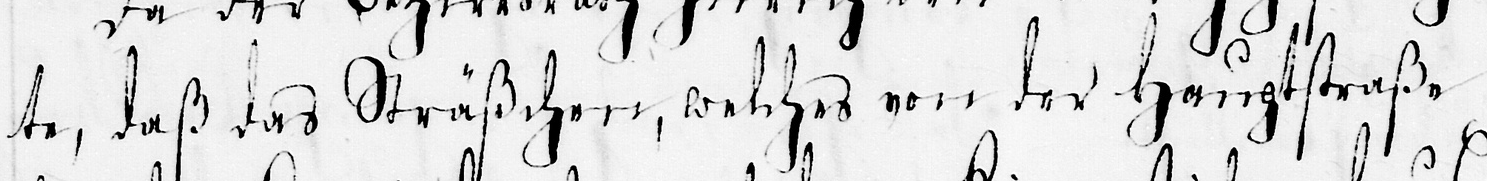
te, daß das Sträßchen, welches von der Hauptstraße
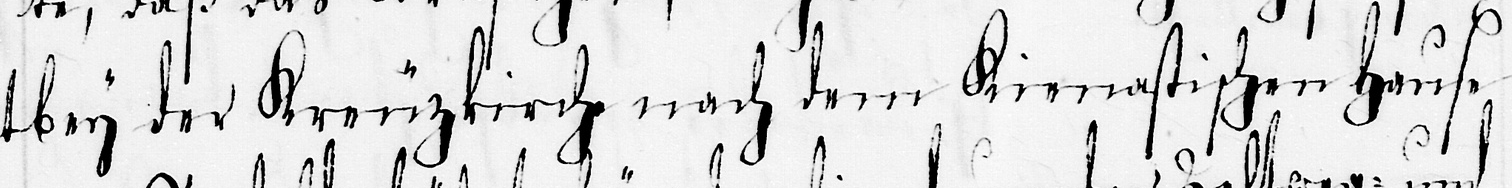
bey der Kreuzkirche nach dem Kienastischen Hause
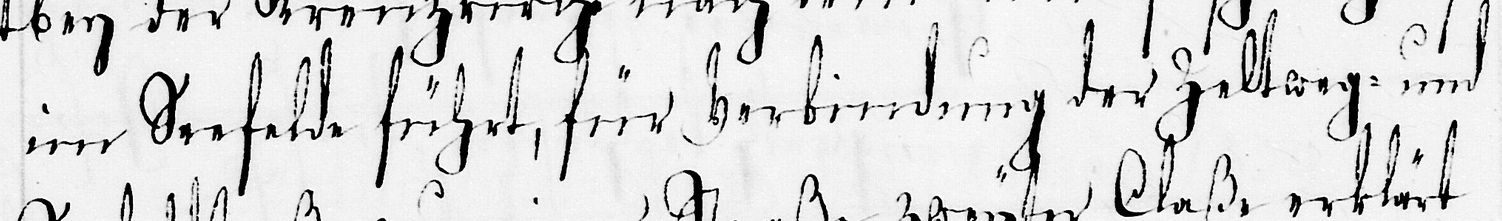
im Seefelde führt, für Verbindung der Zeltweg- und
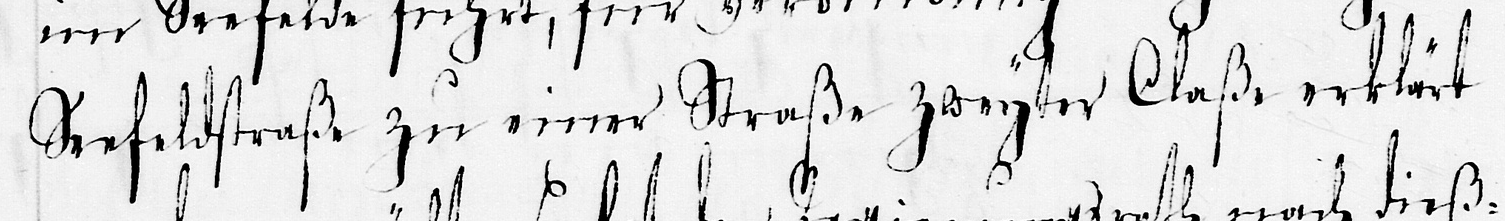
Seefeldstraße zu einer Straße zweyter Claße erklärt
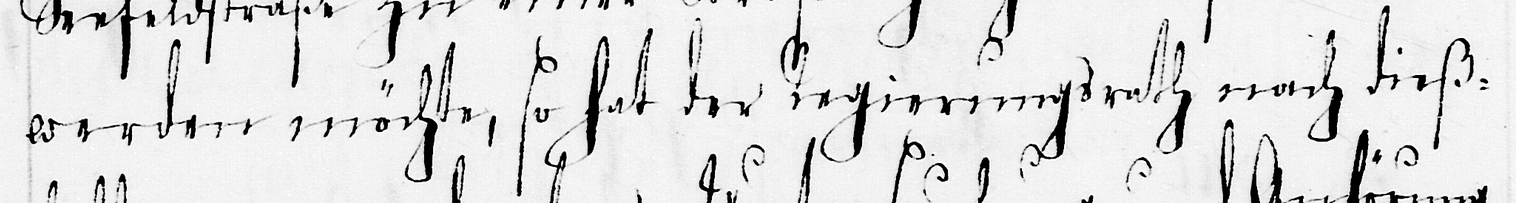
werden möchte, so hat der Regierungsrath nach dieß¬
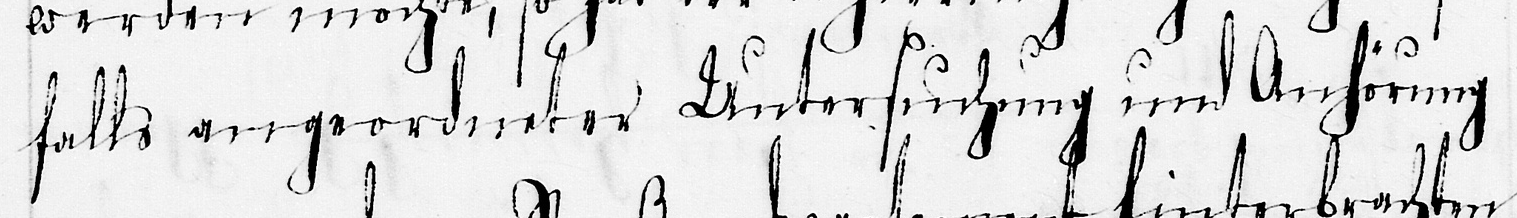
falls angeordneter Untersuchung und Anhörung
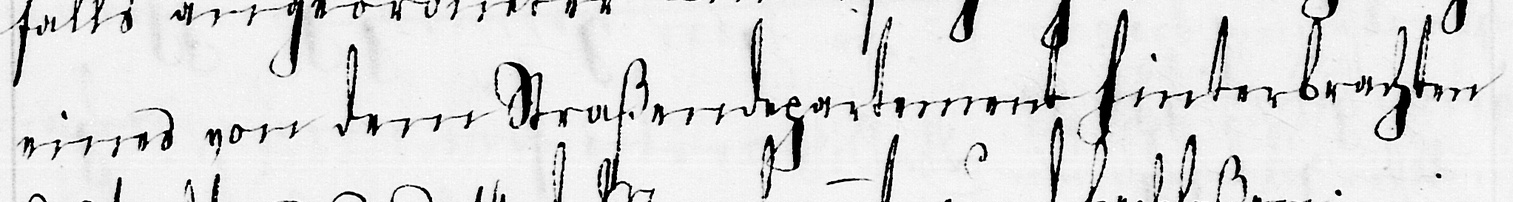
eines von dem Straßendepartement hinterbrachten
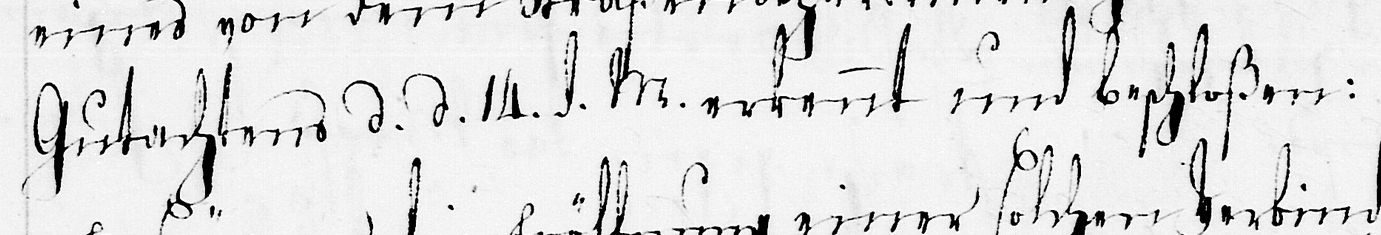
Gutachtens d. d. 14. d. M. erkennt und beschloßen:
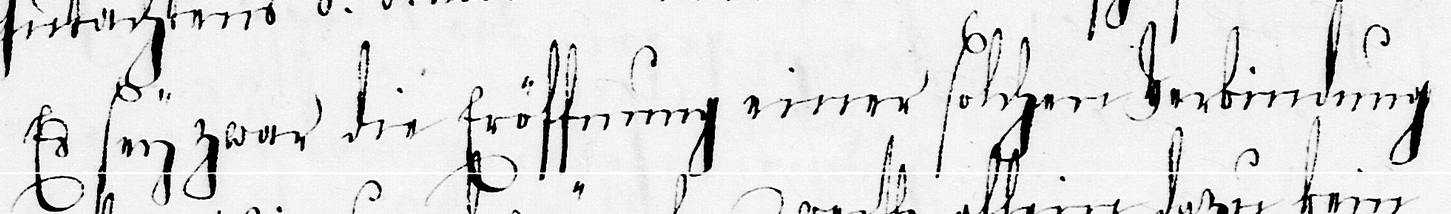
Es sey zwar die Eröffnung einer solchen Verbindung
